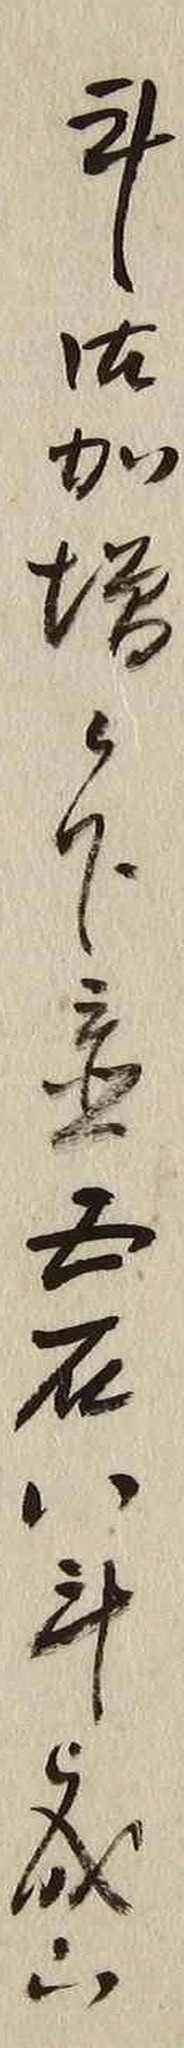斗御加増被下置五石八斗被成下
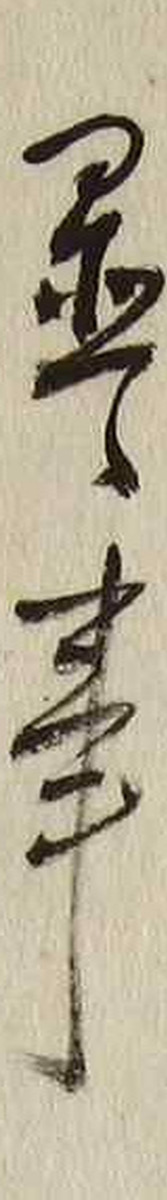置候事
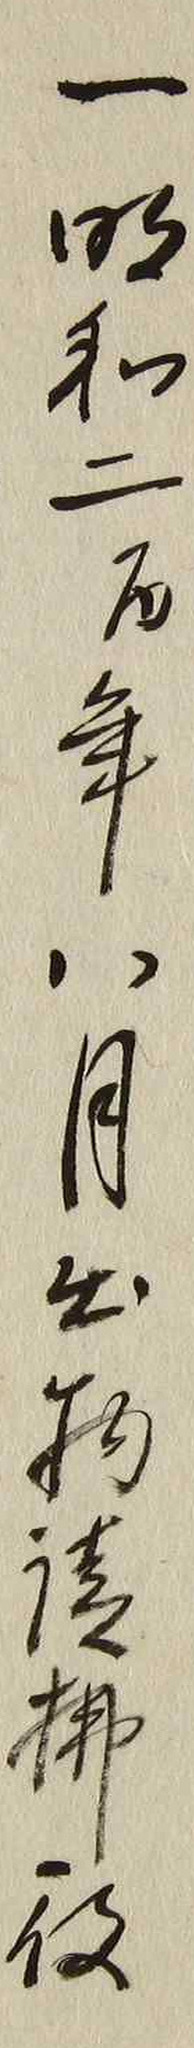一明和二酉年八月出物請払役
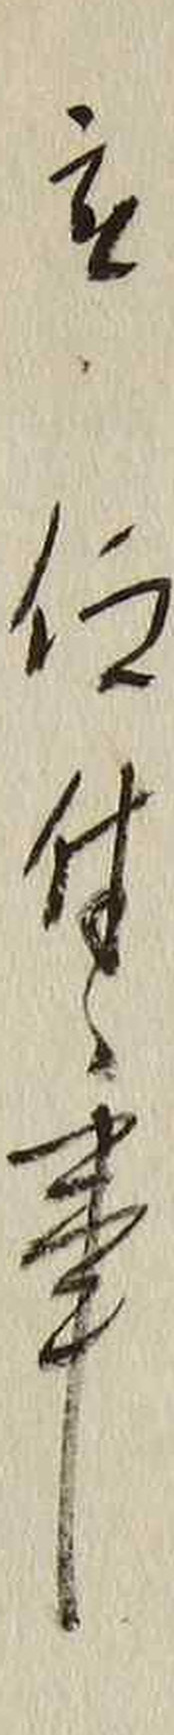被仰付候事
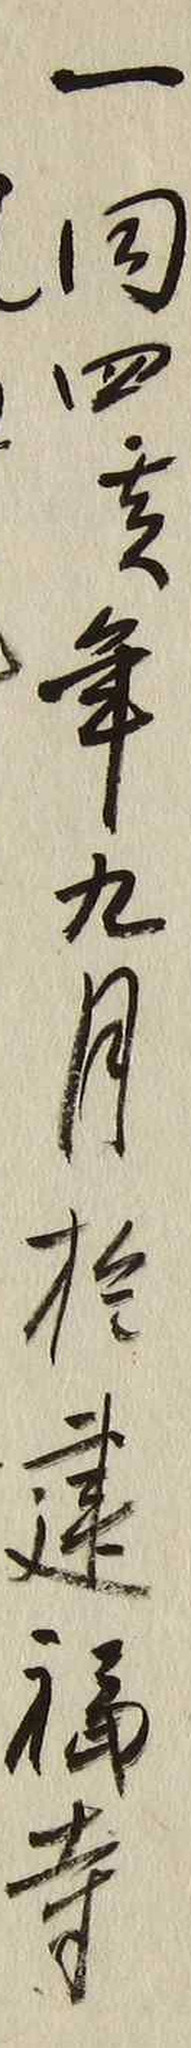一同四亥年九月於建福寺
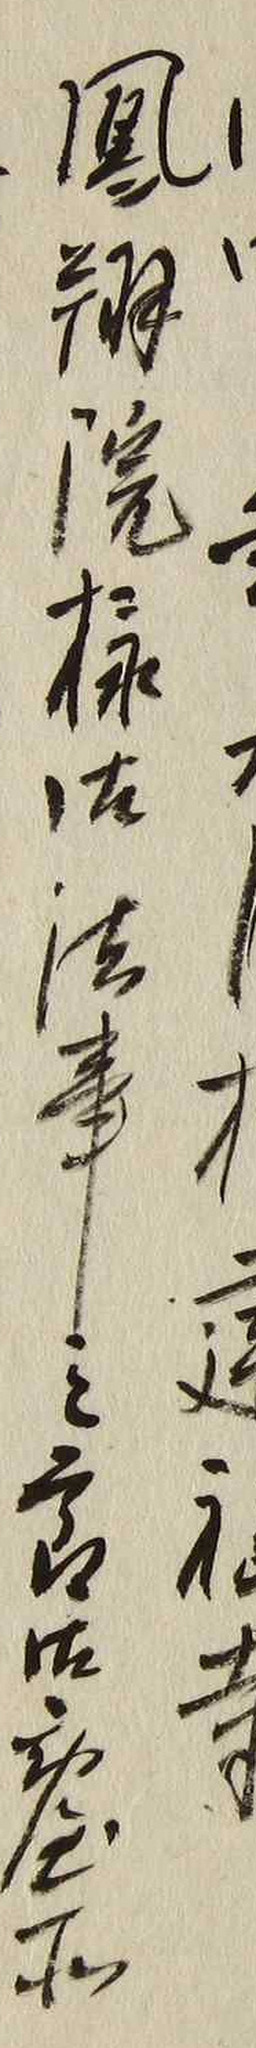鳳翔院様御法事之節御台所
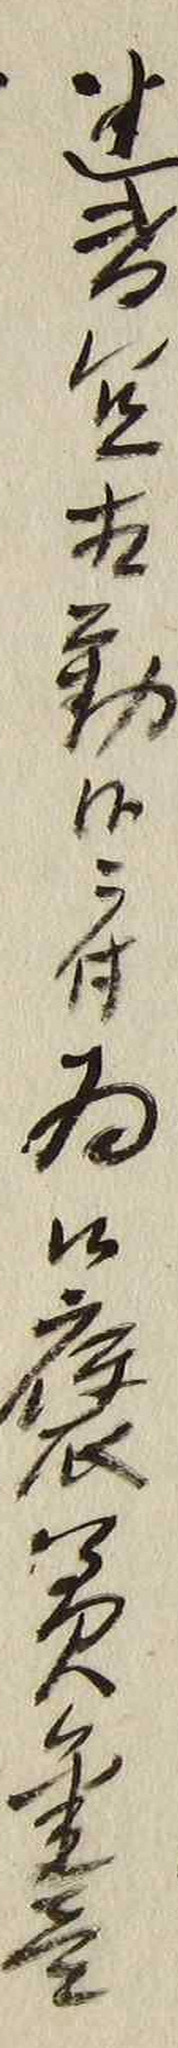建替宜相勤候ニ付為御褒美筆壱
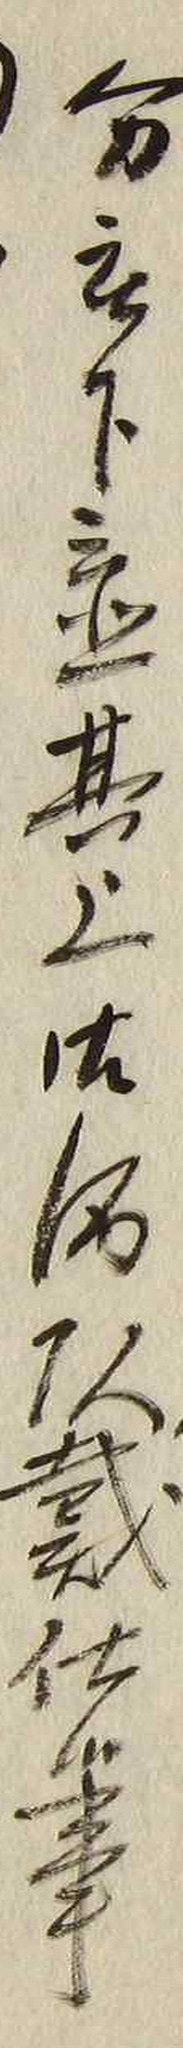分被下置其上御酒頂戴仕候事
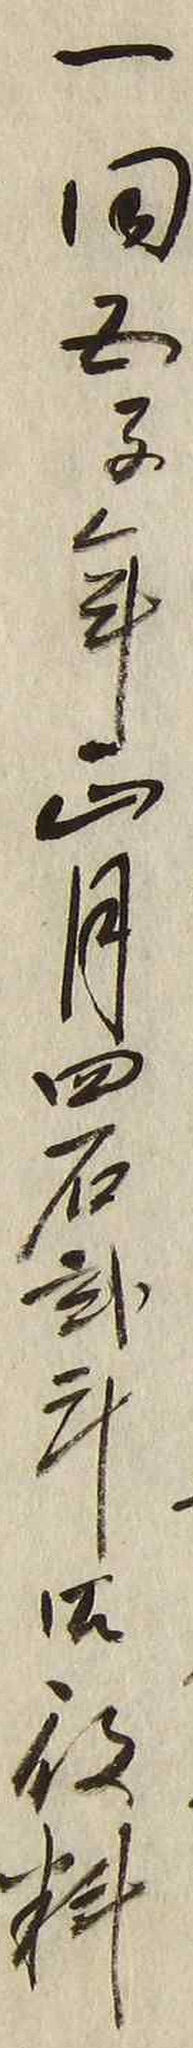一同五子年正月四石弐斗御役料

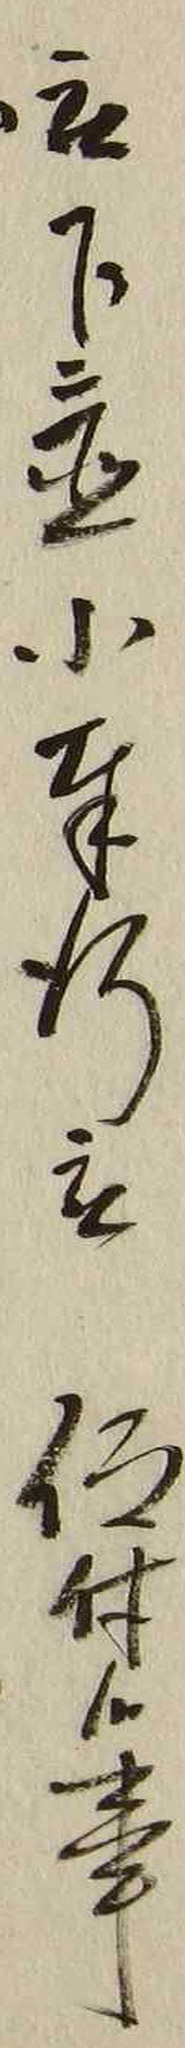被下置小奉行被仰付候事
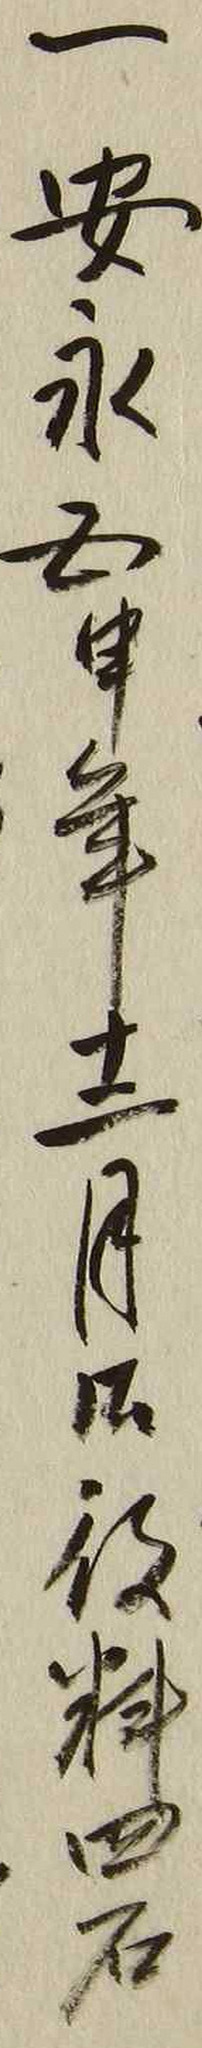一安永五申年十二月御役料四石
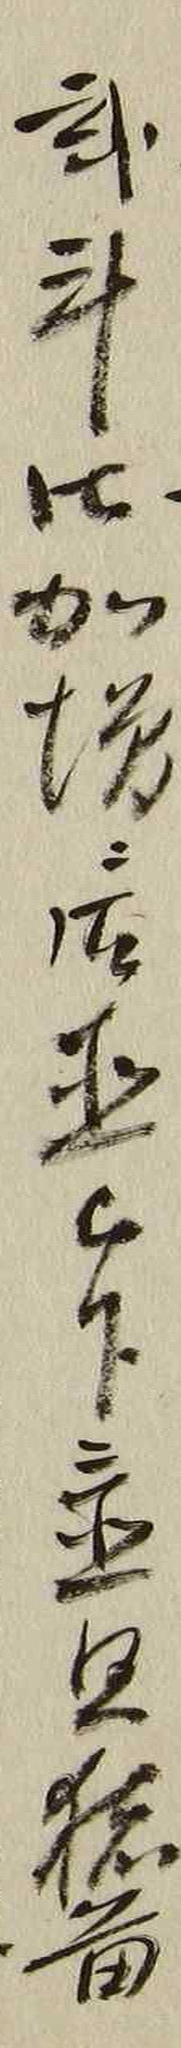弐斗御加増ニ御直被下置且猪苗
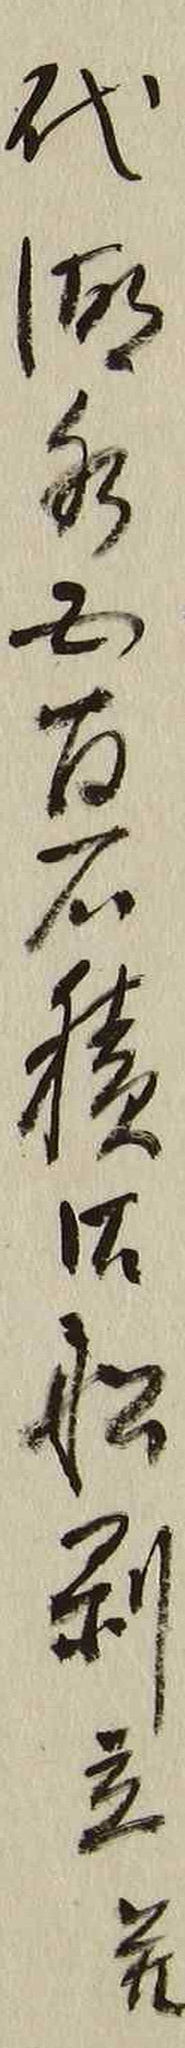代湖水五百石積御船剥立并
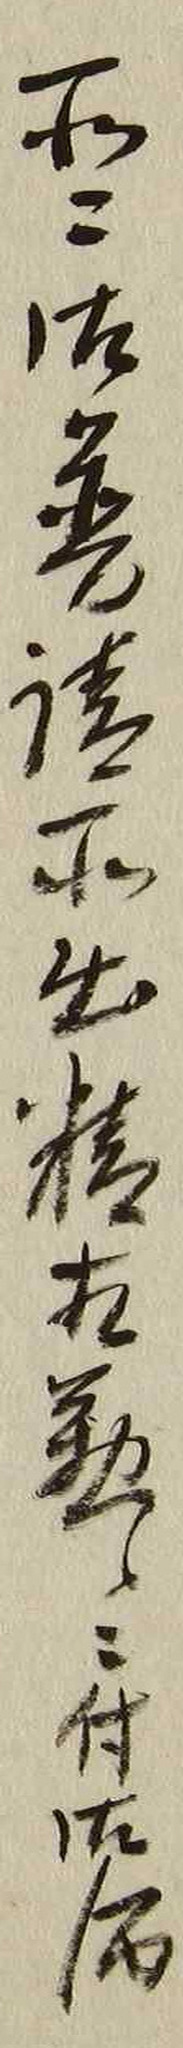所々御普請所出精相勤候ニ付御酒
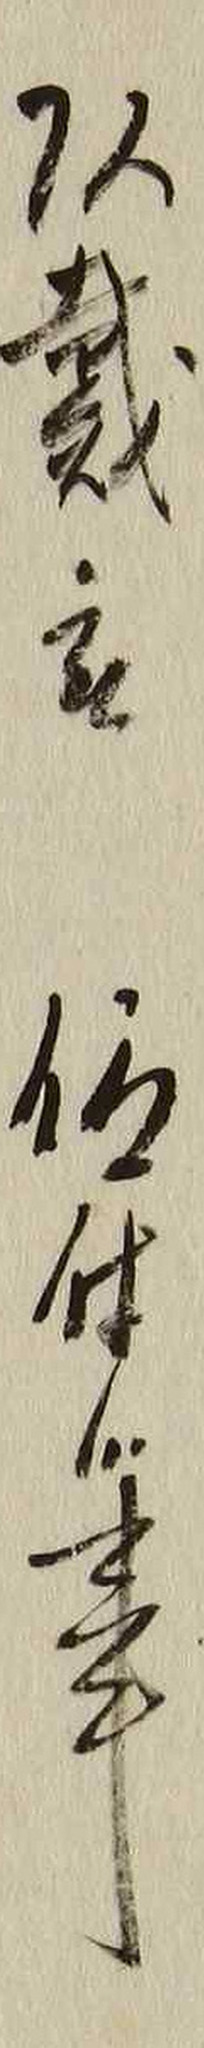頂戴被仰付候事
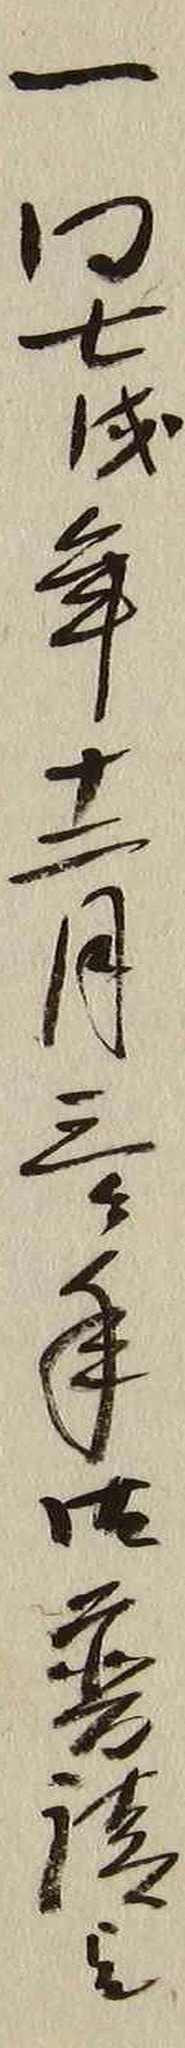一同七戌年十二月三ケ年御普請被
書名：諸士系譜　巻之353　す之部3
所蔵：会津若松市立会津図書館
